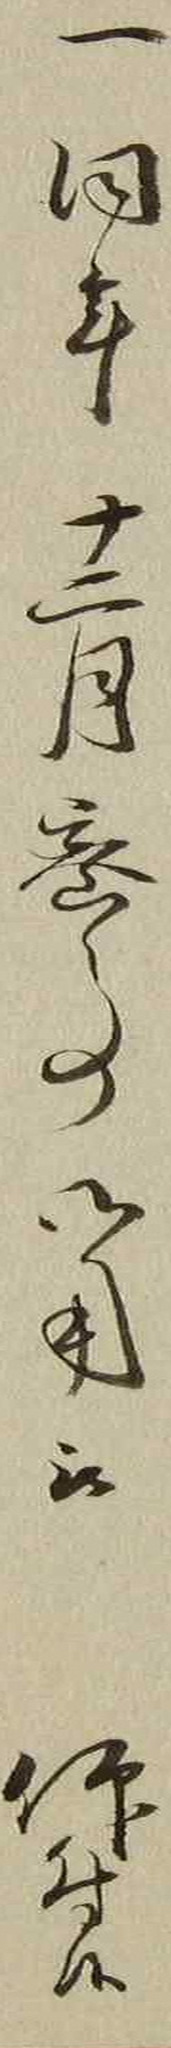一同年十二月密事御用被仰付候
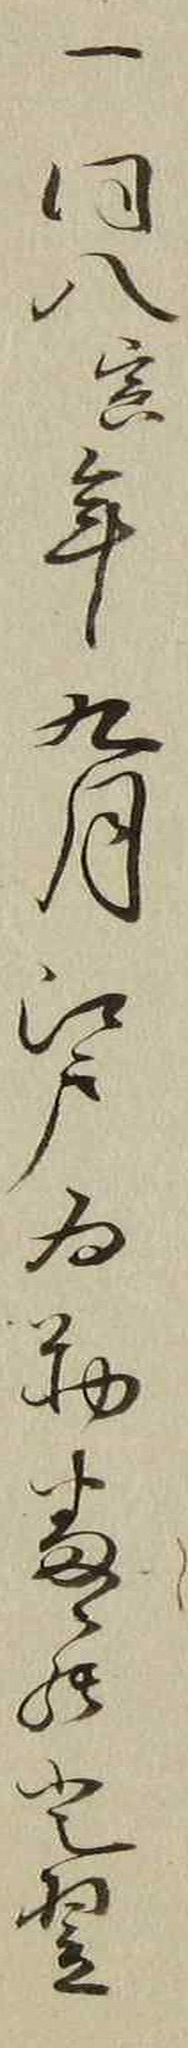一同八寅年九月江戸為勤番ニ罷登翌
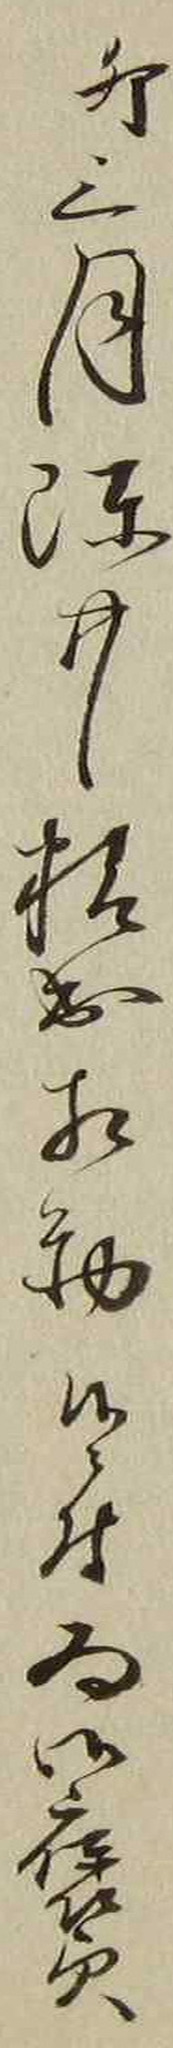卯三月陣中精出相勤候ニ付為御褒美
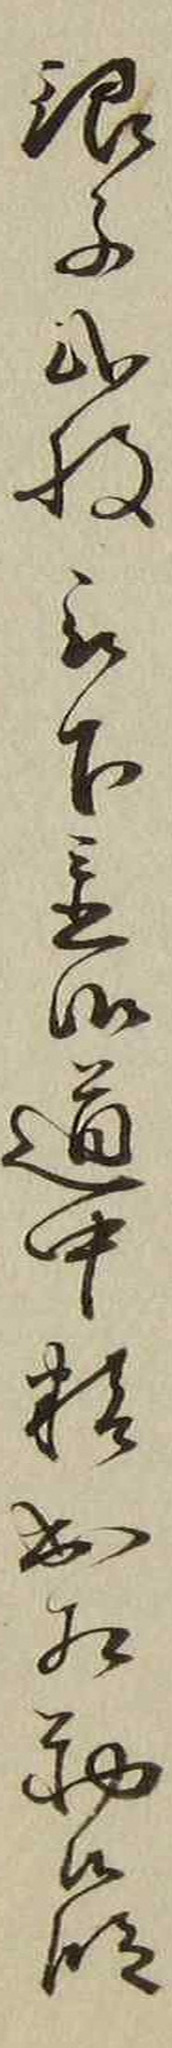銀子弐枚被下置候道中精出相勤候段
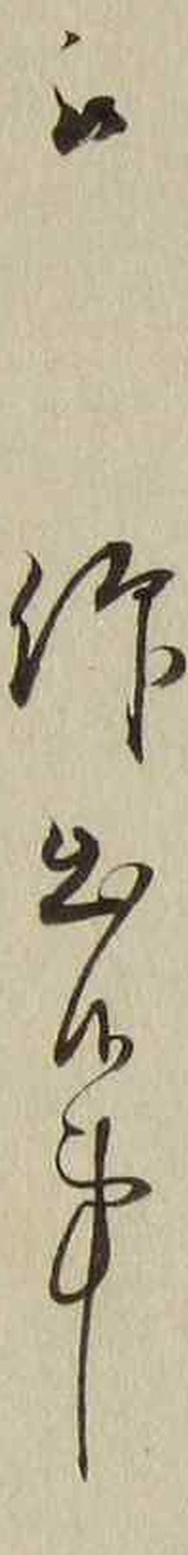被仰出候事

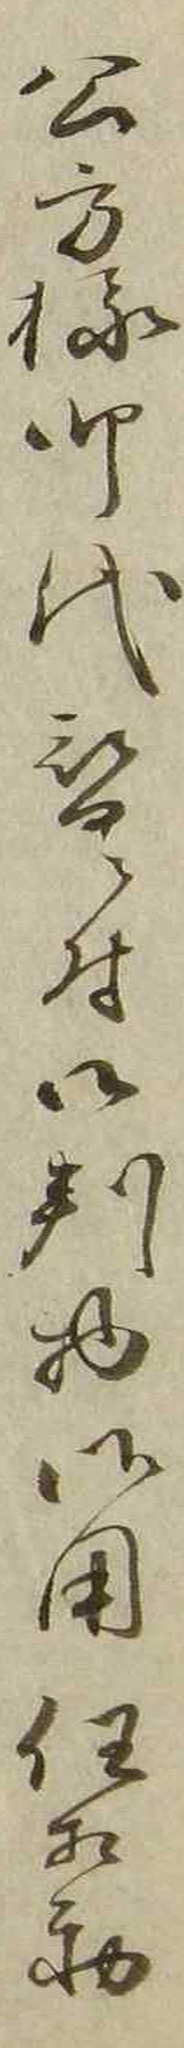公方様御代替ニ付御判物御用任相勤
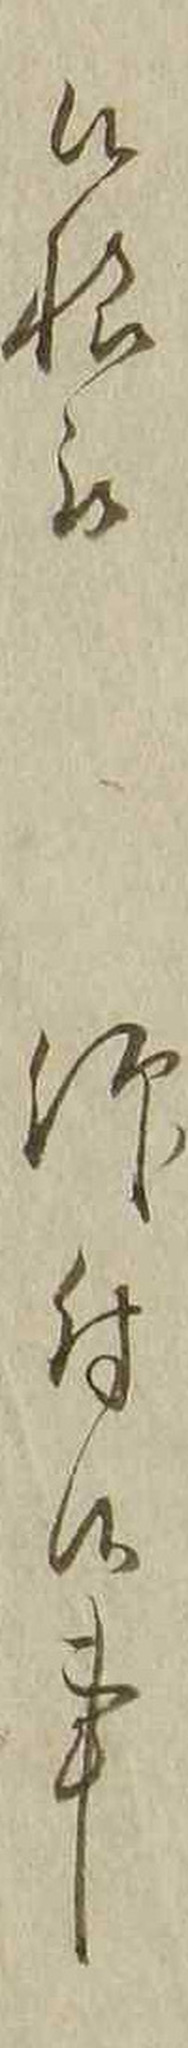候様被仰付候事
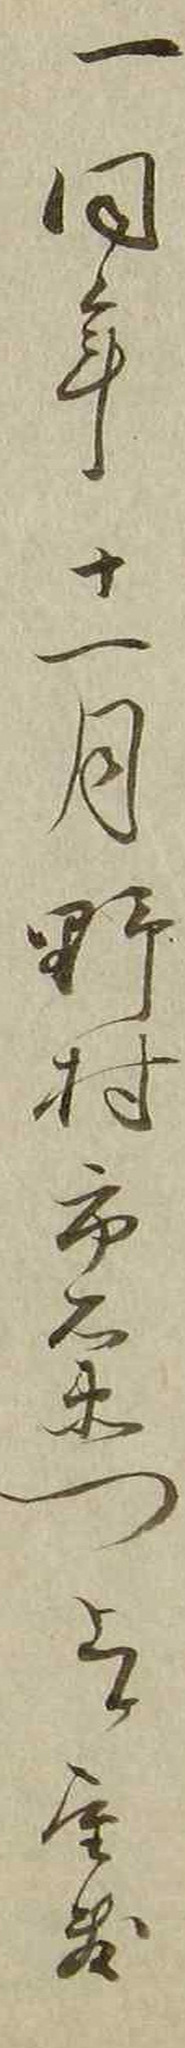一同年十一月野村市右衛門上ヶ屋敷
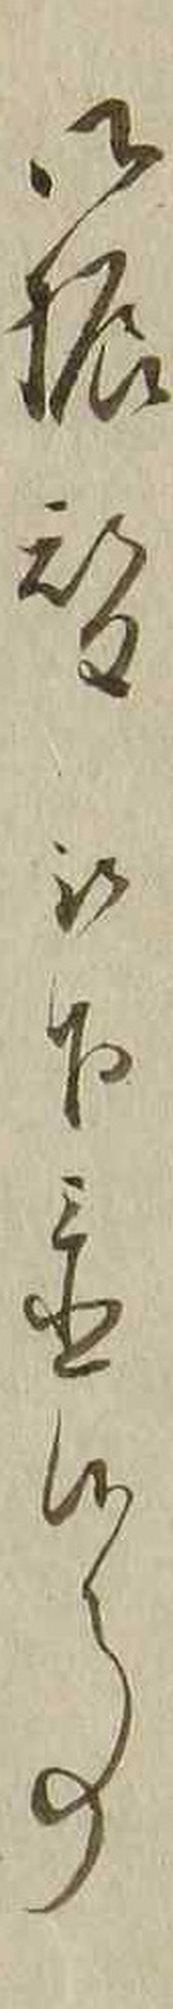御振替被下置候事
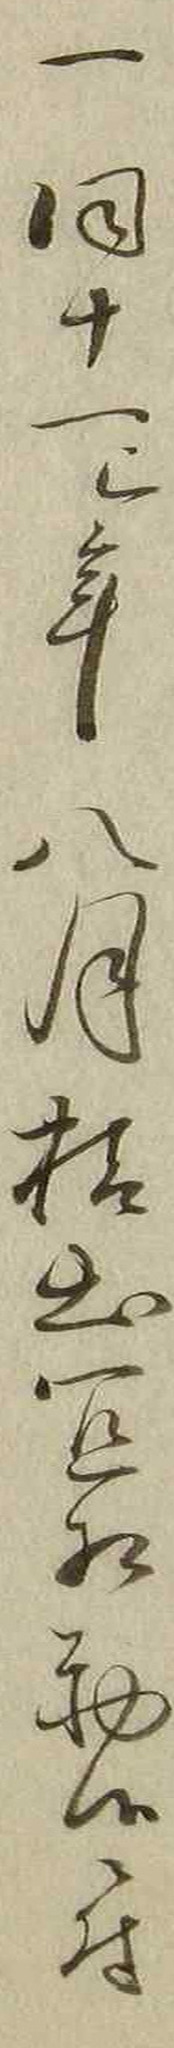一同十一巳年八月精出宜相勤候ニ付
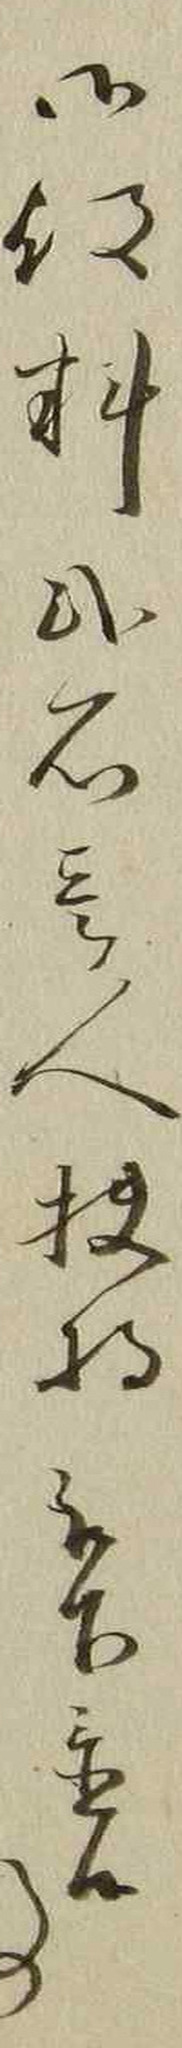御役料弐石壱人扶持被下置候事
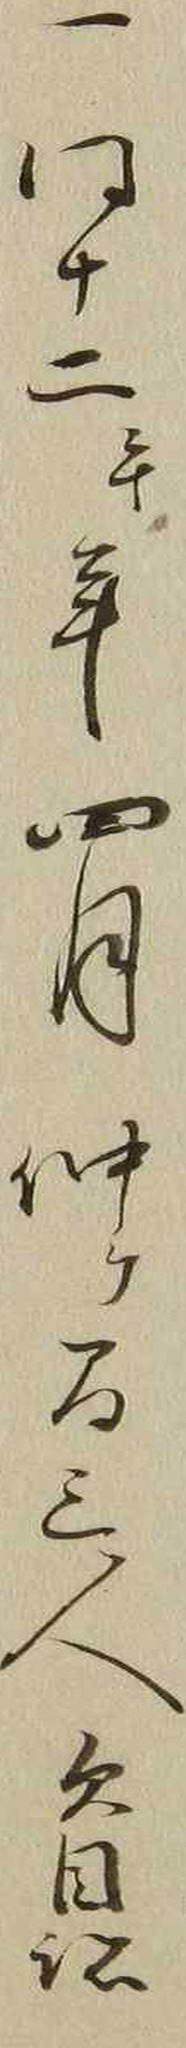一同十二午年四月仲ヶ間三人欠目跡
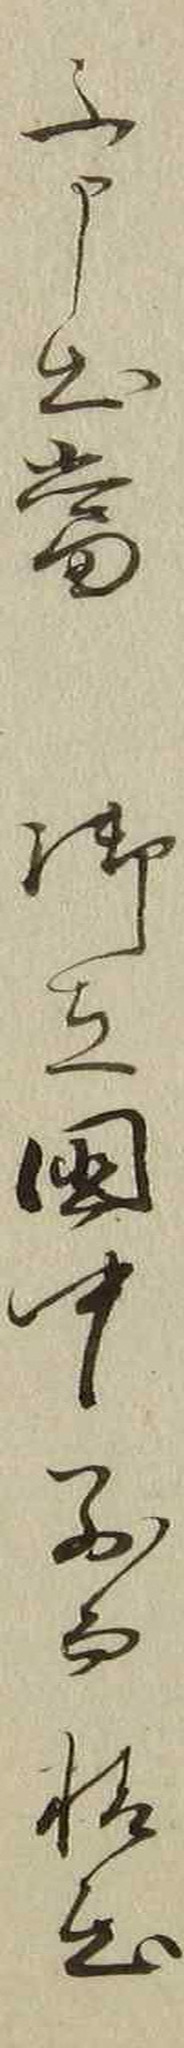不申出当御在国中別而精出
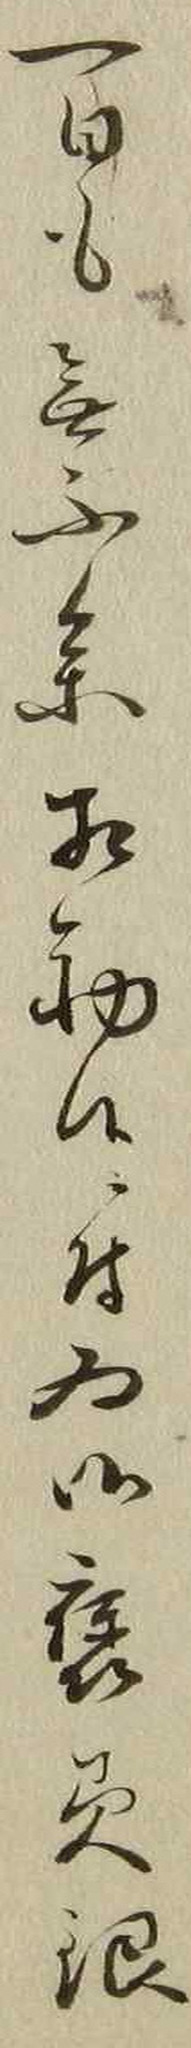一日も無不参相勤候ニ付為御褒美銀
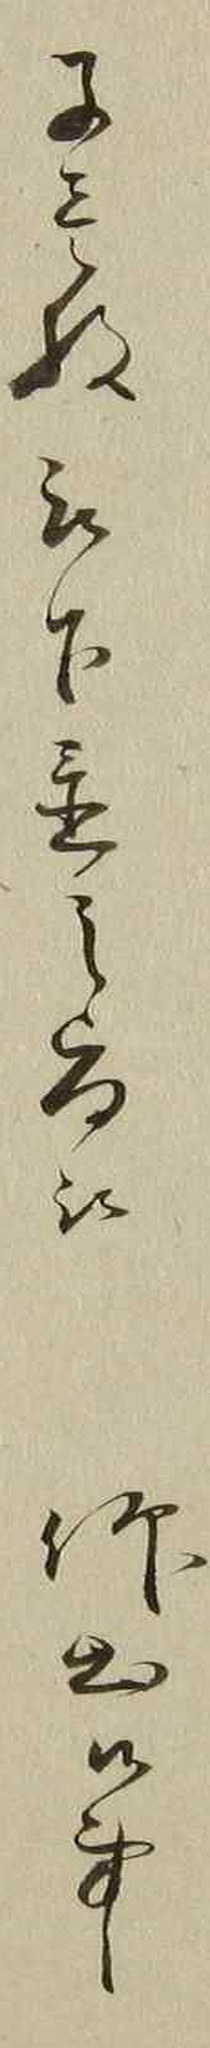子壱枚被下置之旨被仰出候事
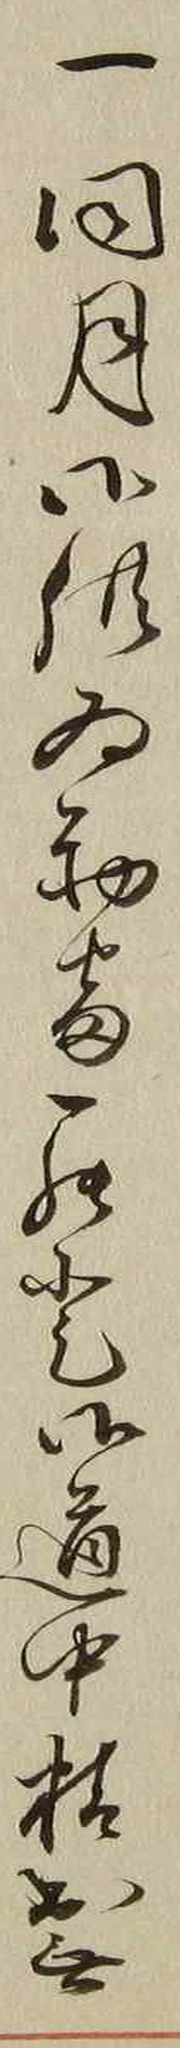一同月御供為勤番罷登御道中精出無
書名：諸士系譜　巻之52　に之部3
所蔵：会津若松市立会津図書館
